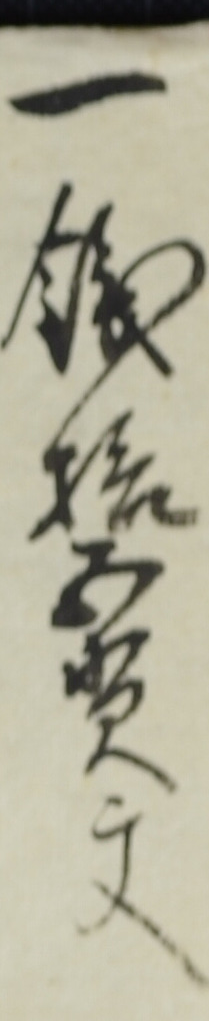一銭拾五貫文
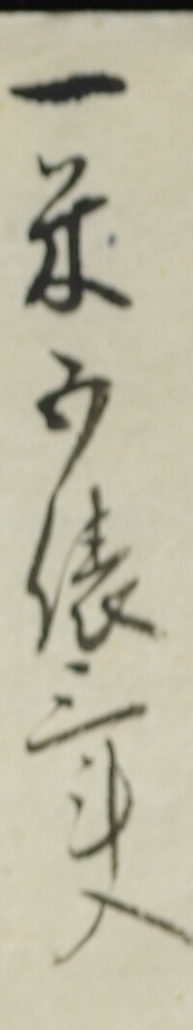一米五俵三斗入
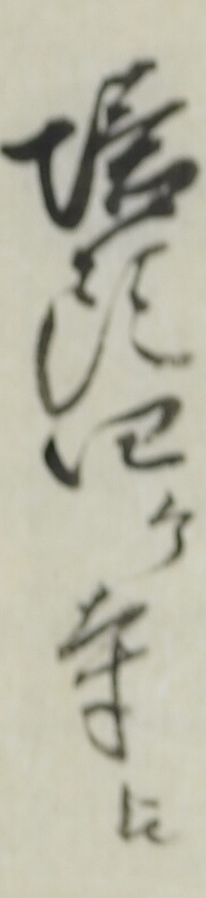塔頭四ヶ寺江

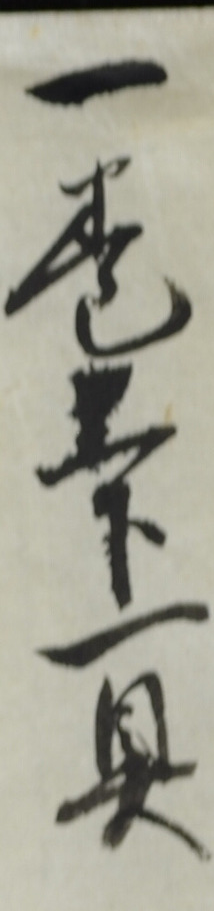一巻上下一具
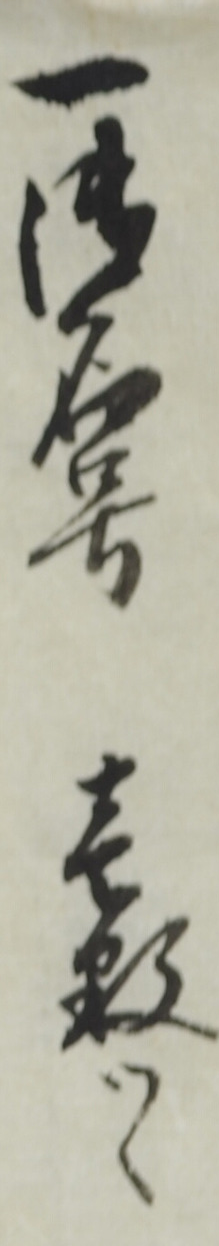一御名号壱数ツヽ
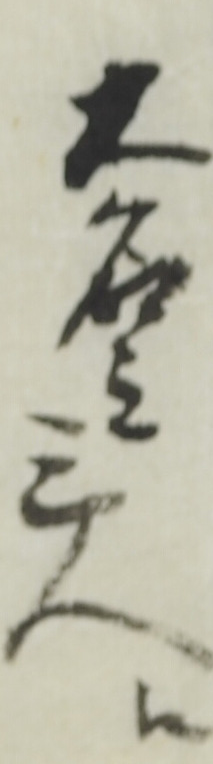大名主三人江
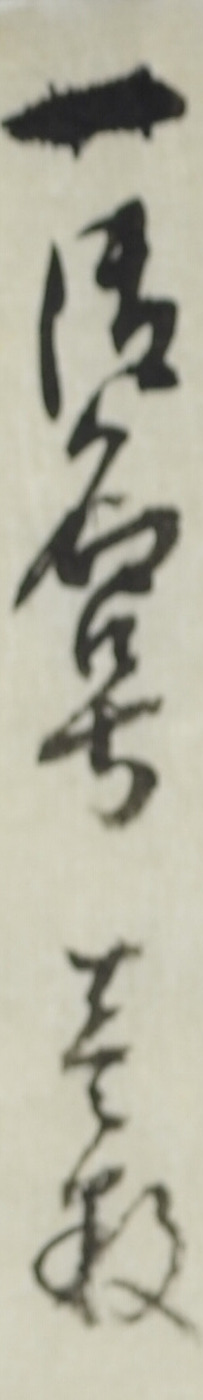一御名号壱数
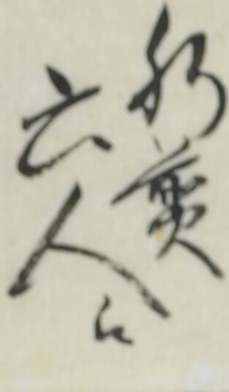六人江
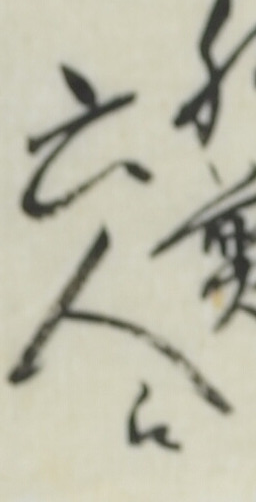六人江
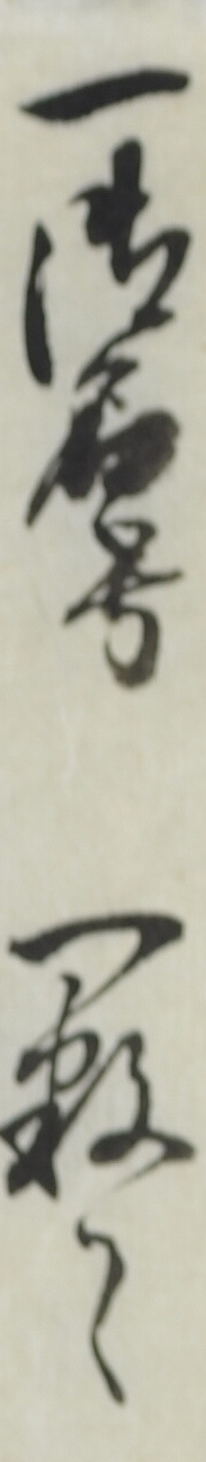一御名号一数ツヽ
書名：遊行上人様御札守被下候留書
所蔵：伊那市立高遠町図書館・合同会社AMANE
